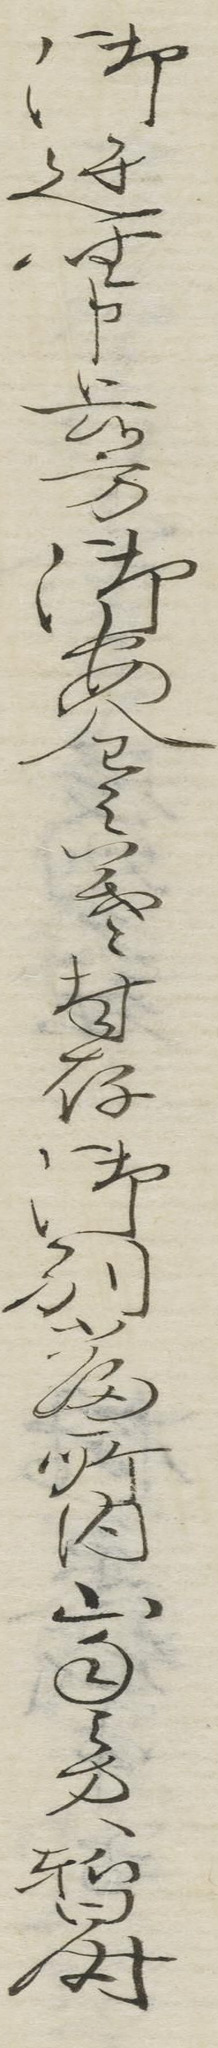御遷座申上候方御安全之義ニ奉存御別当所内山手之方へ暫時
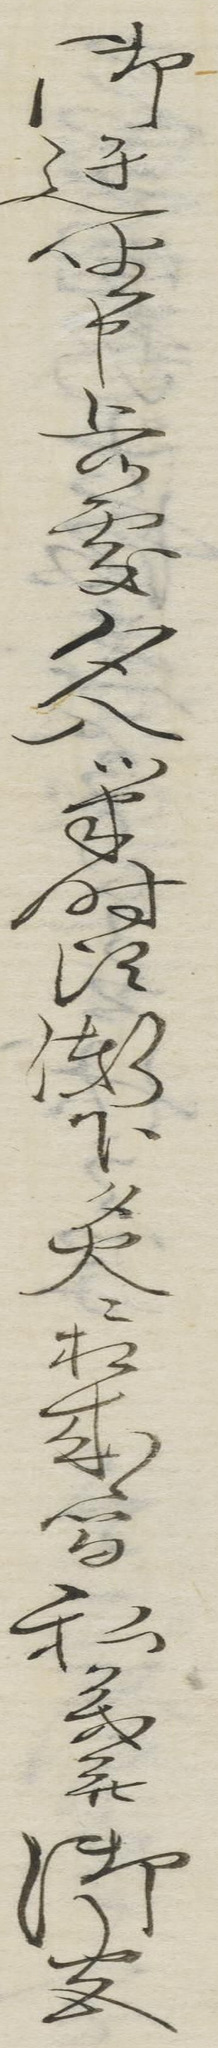御遷座申上候処夕八ッ半時頃漸下タ火ニ相成候間私義幷御宮
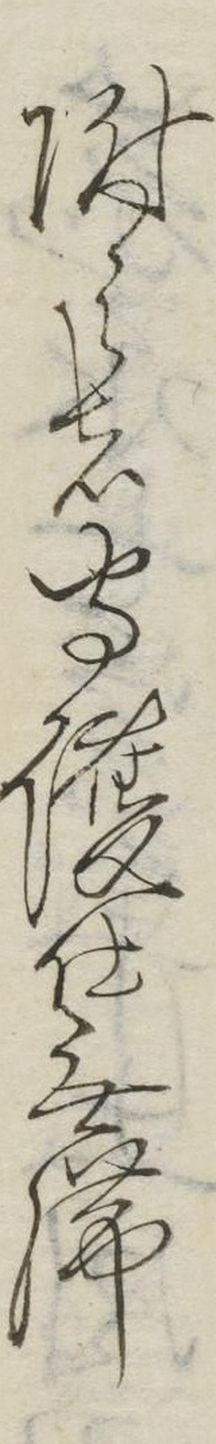付之者守護仕無滞
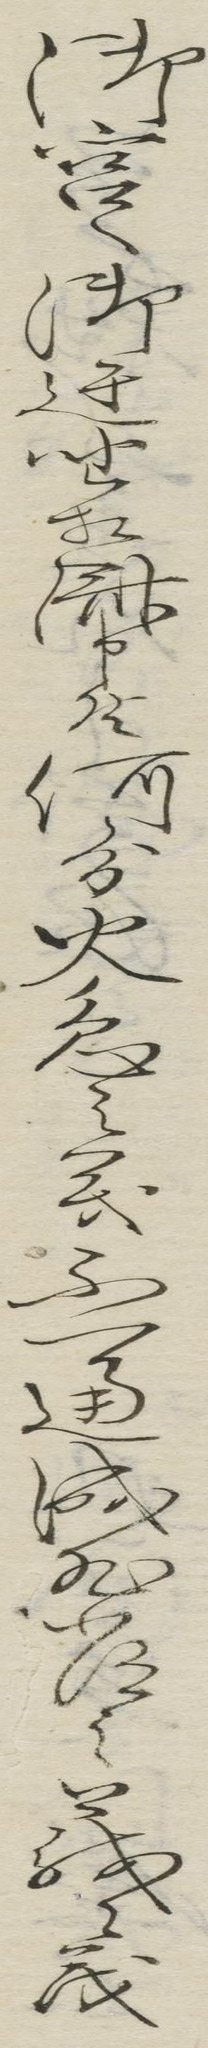御宮ヘ御遷座相済申候何分火急之義不一通成非常之義ニ茂
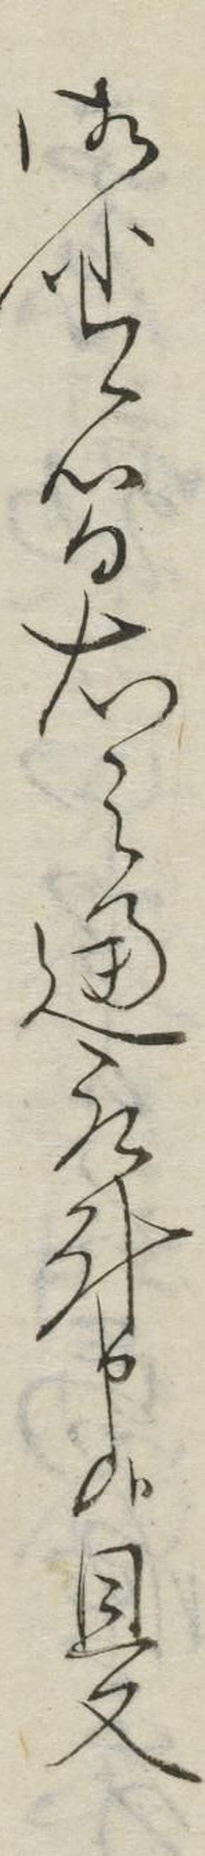御座候間右之通取斗申候且又
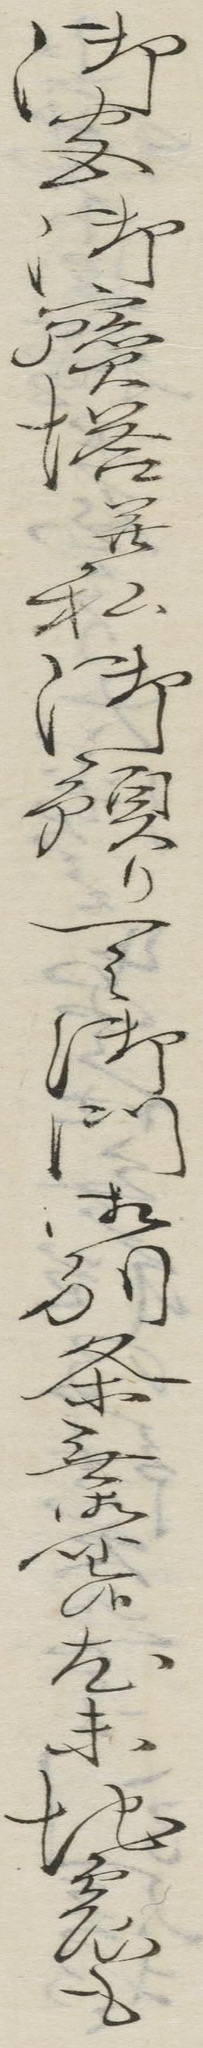御宮御寶塔幷私御預り一之御門御別条無御座候尤未地震も
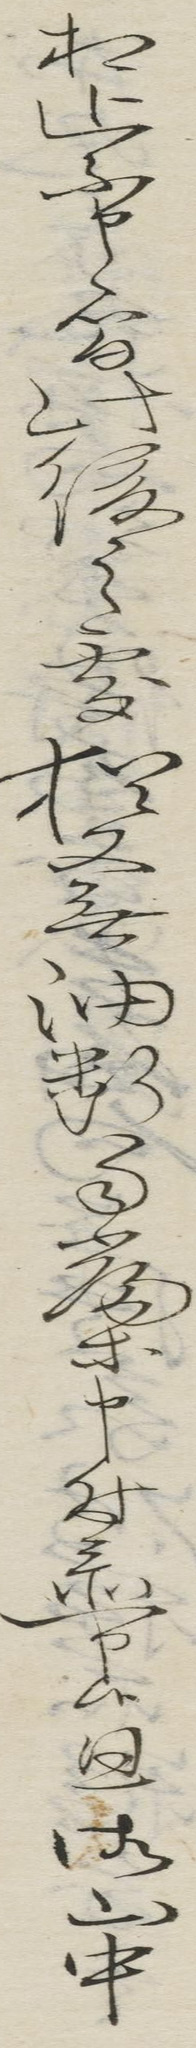相止不申候間此後之処猶又無油断手当等申付置申候且御山中
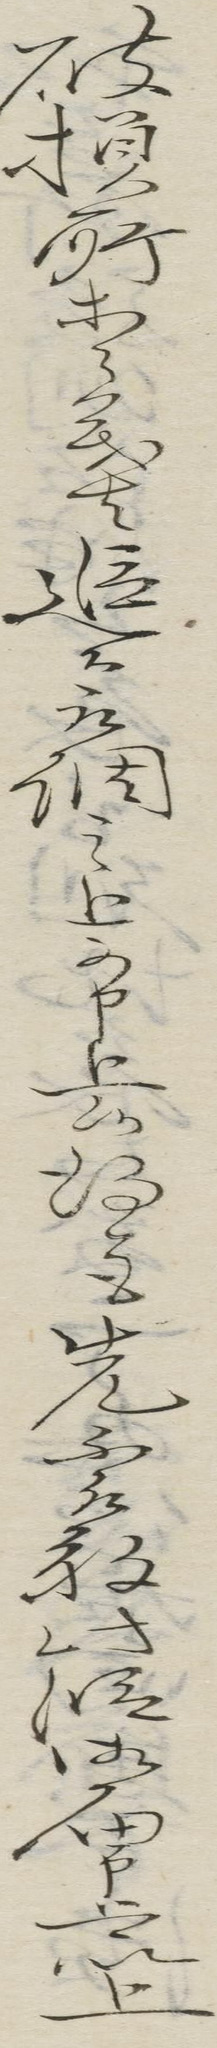破損所等之義は追而取調之上可申上候得とも先不取敢此段御届申上候以上
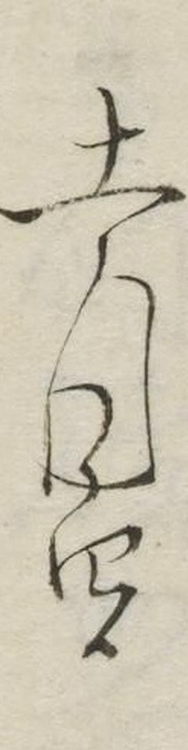十一月四日
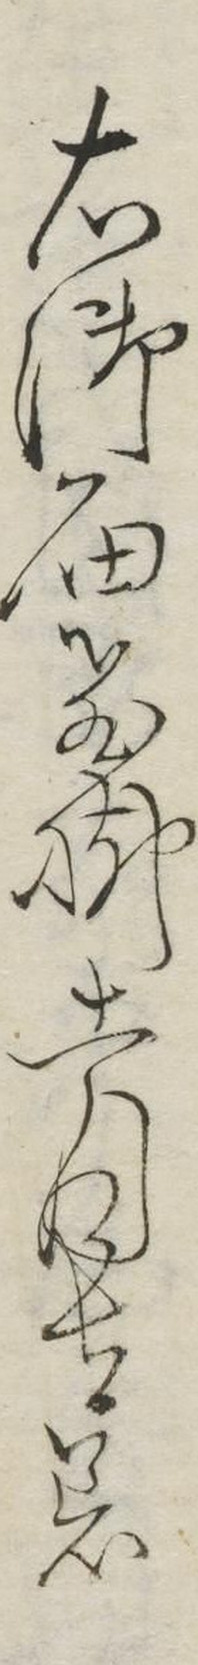右御届飛脚十一月七日着
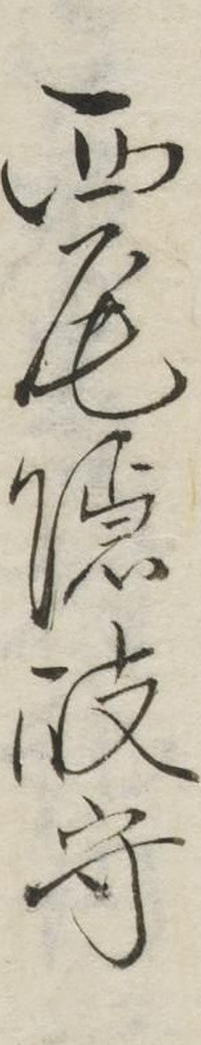西尾隠岐守
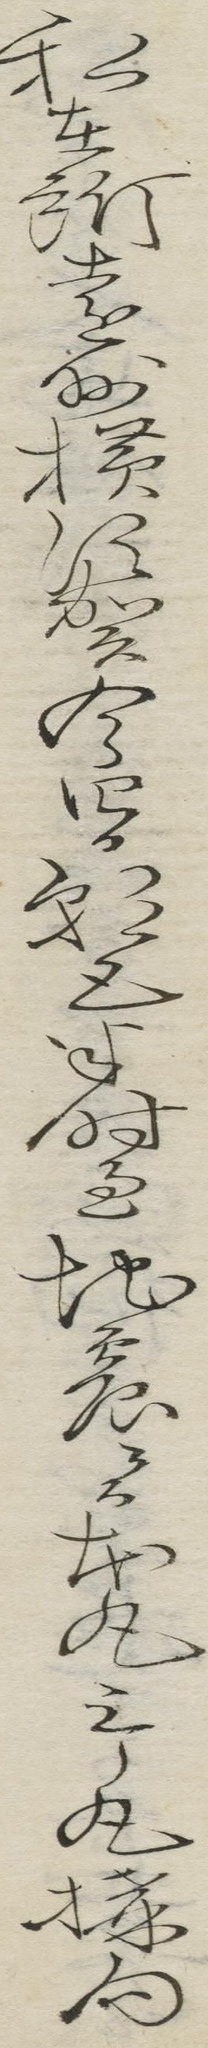私在所遠州横須賀今四日朝巳半時過地震ニ而本丸三ノ丸構向
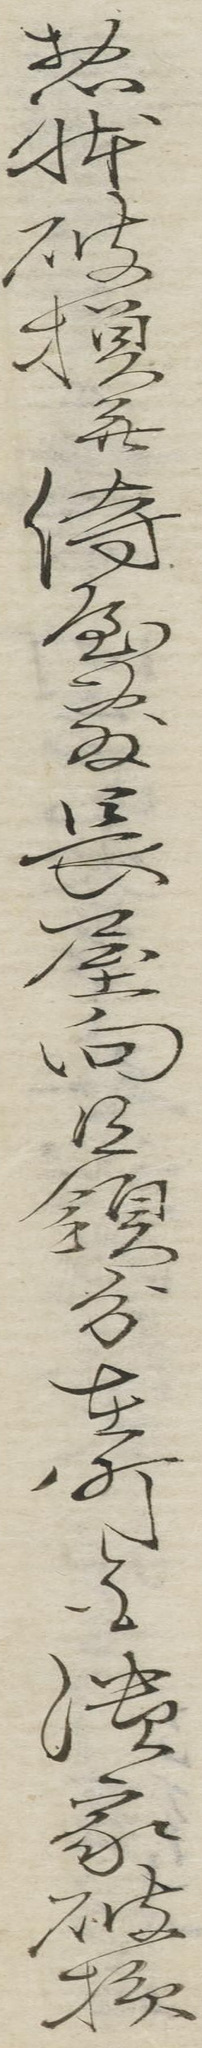惣体破損并侍屋敷長家向の領分在町とも潰家破損

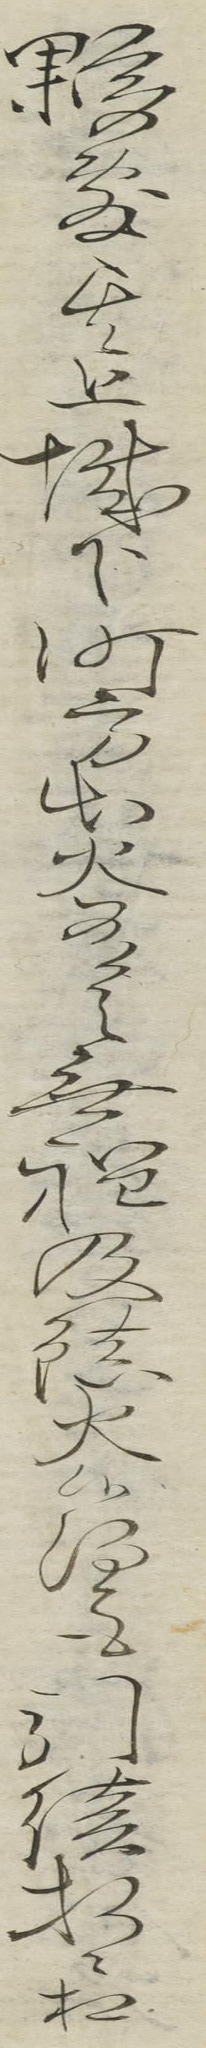夥敷其上城下町方出火有之無程及び鎮火候得とも引続折々相
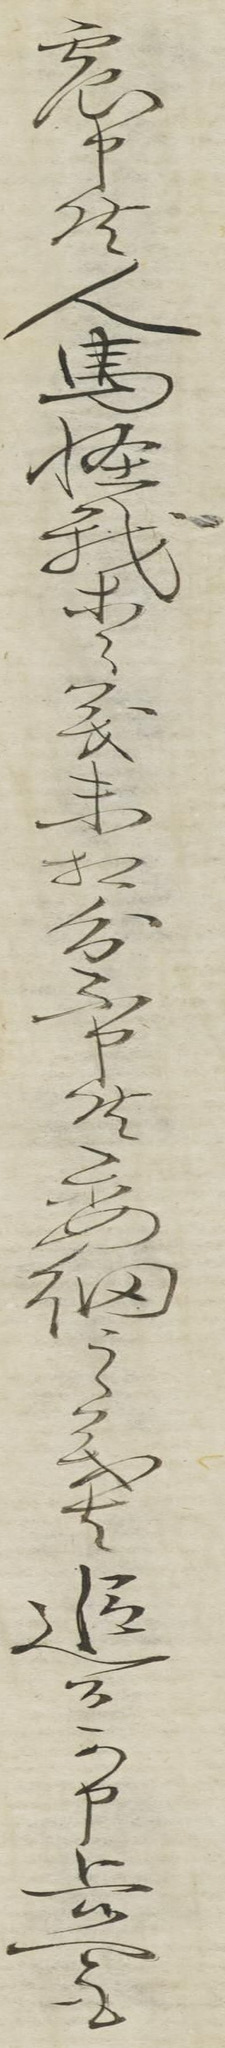震申候人馬怪我等之義未相分申候委細之義は追而可申上候へとも
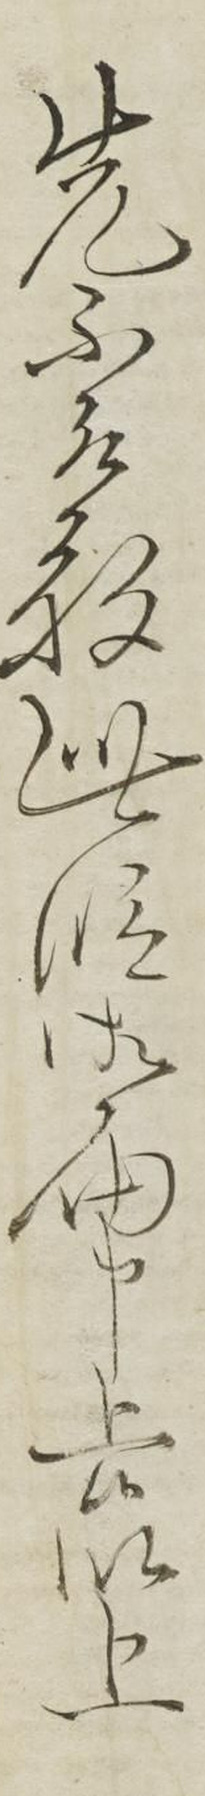先不取敢此段御届申上候以上
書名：大地震實録
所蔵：東京大学地震研究所図書室 Earthquake Research Institute Library, The University of Tokyo, JAPAN
